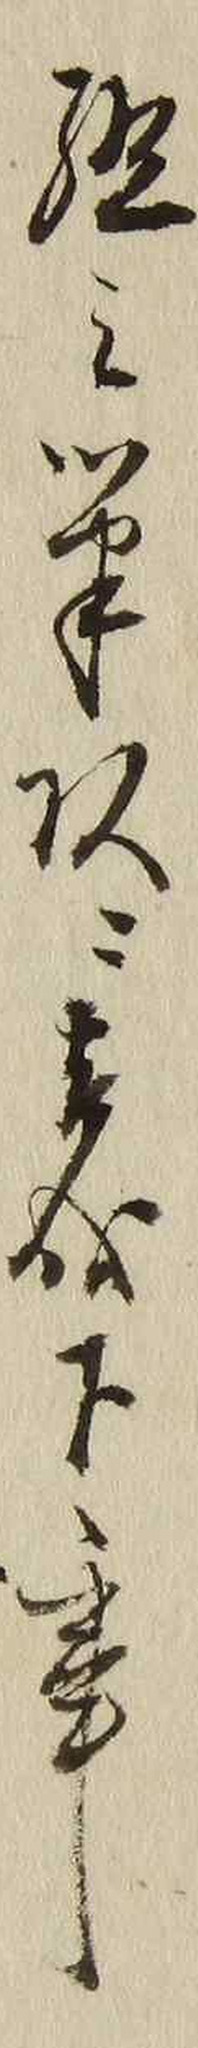組之筆頭ニ被成下候事
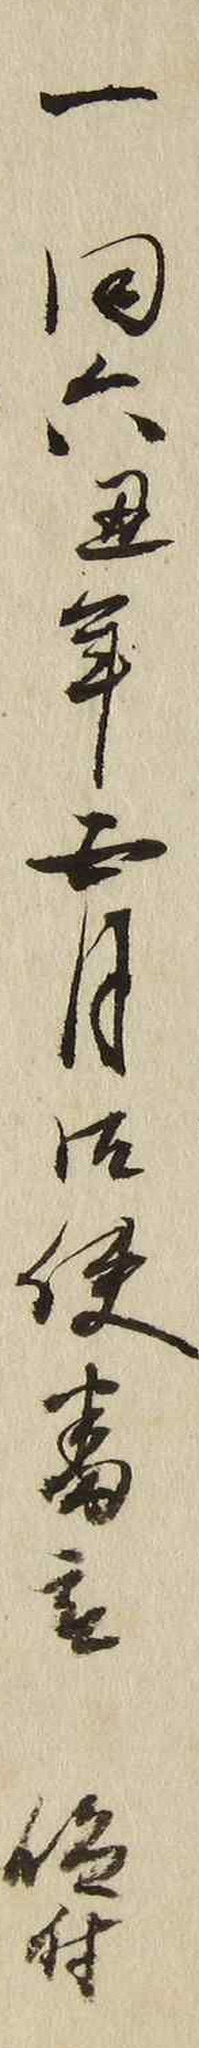一同六丑年七月御使番被仰付
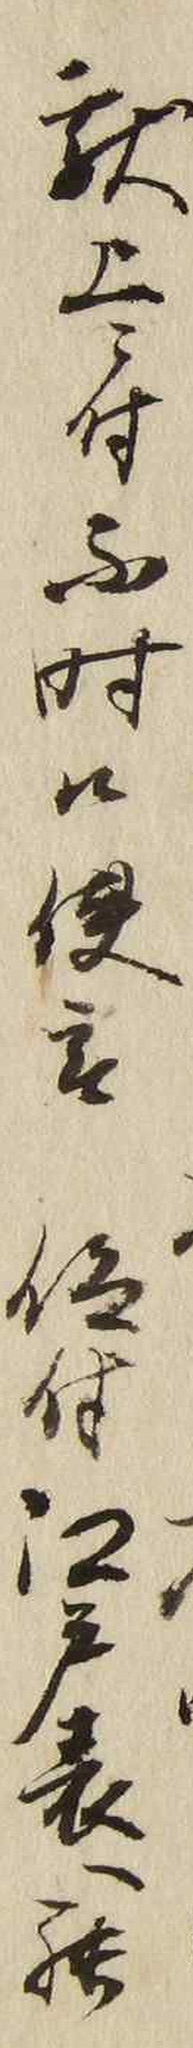献上ニ付不時御使被仰付江戸表へ罷

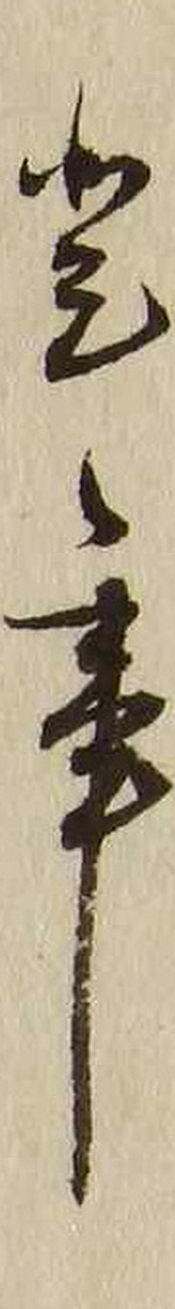登候事
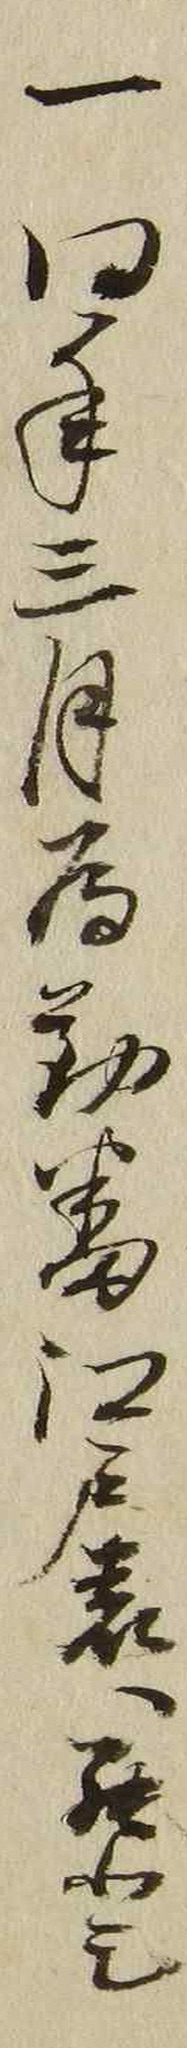一同年三月為勤番江戸表へ罷登
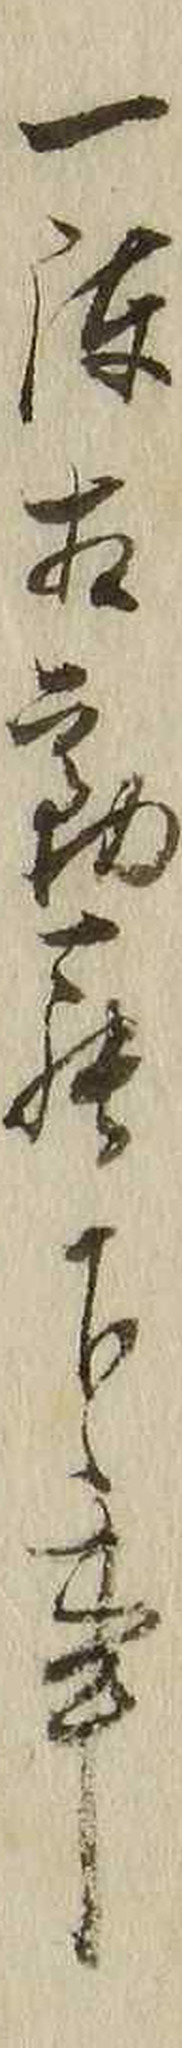一陣相勤罷下候事
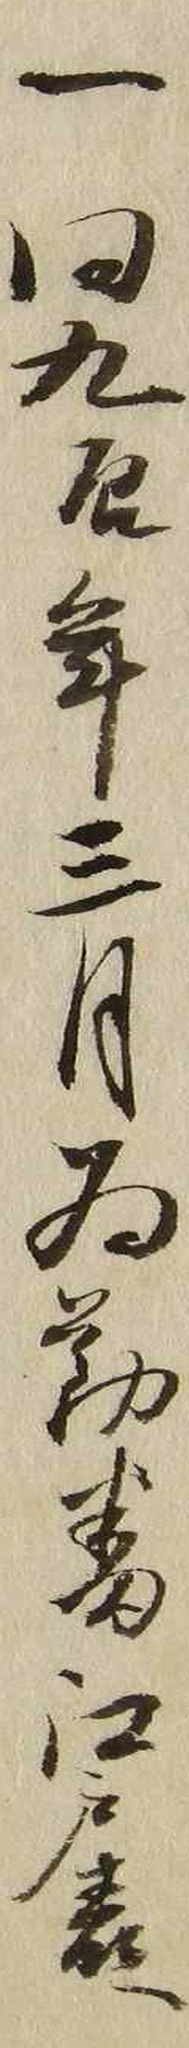一同九辰年三月為勤番江戸表へ
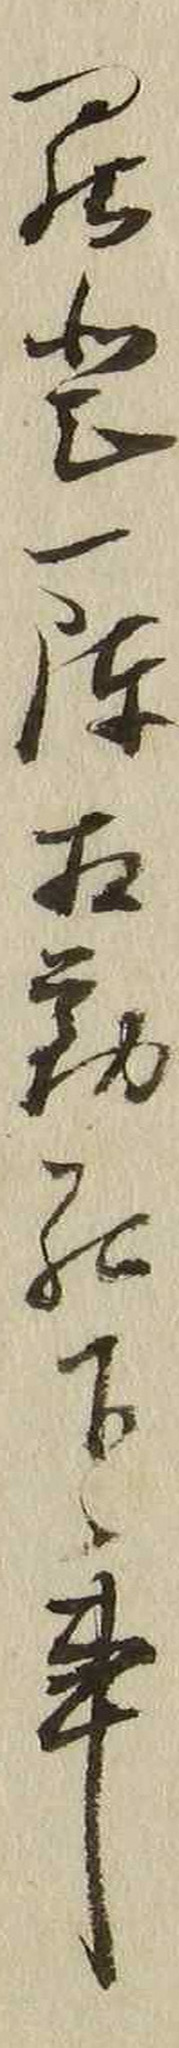罷登一陣相勤罷下候事
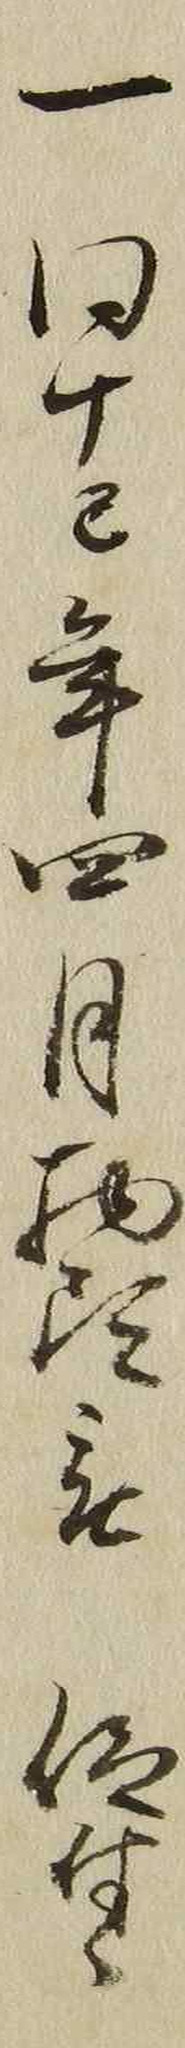一同十巳年四月物頭被仰付候
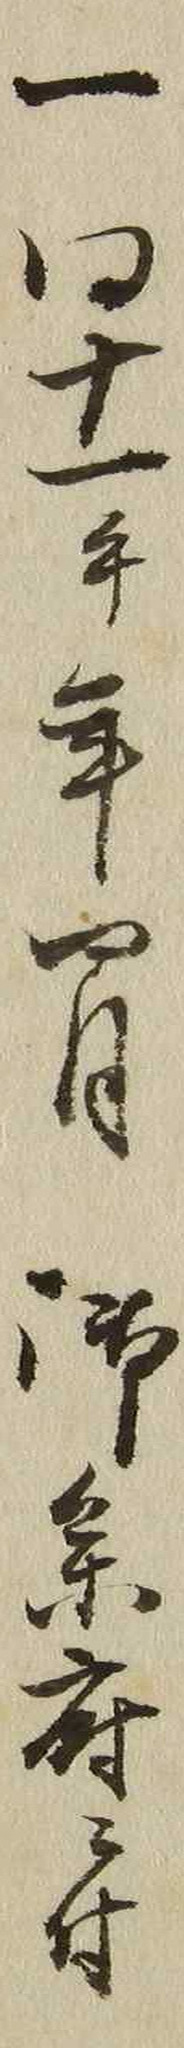一同十一午年四月御参府ニ付
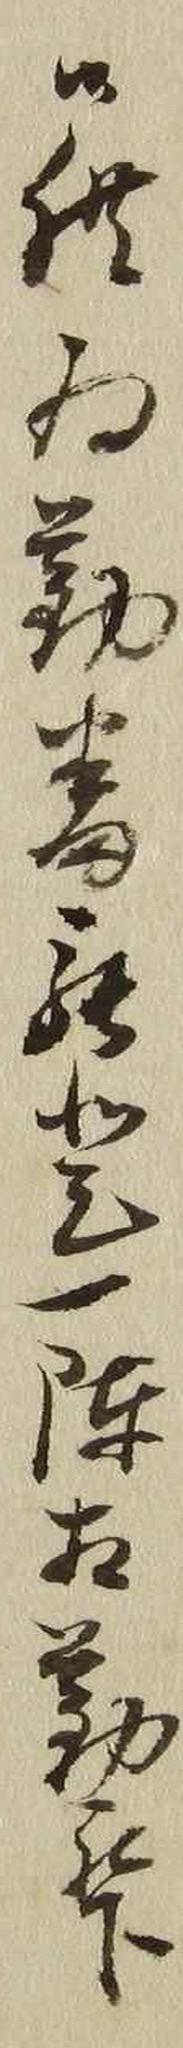御供為勤番罷登一陣相勤罷下
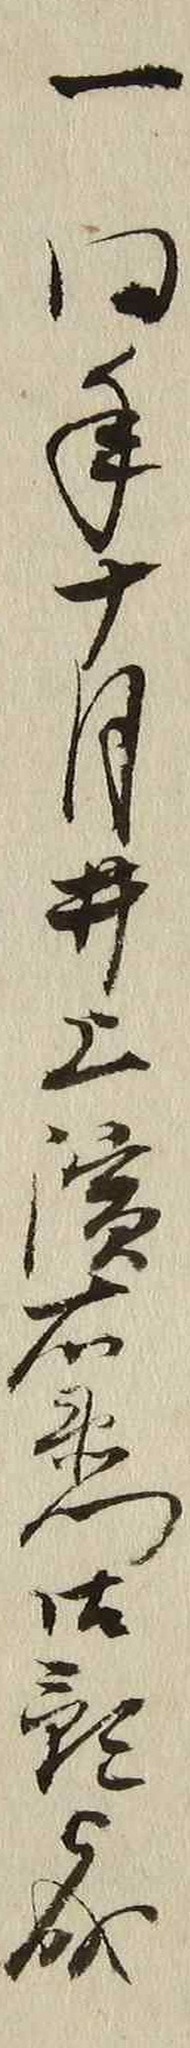一同年十月井上浜右衛門御預被成
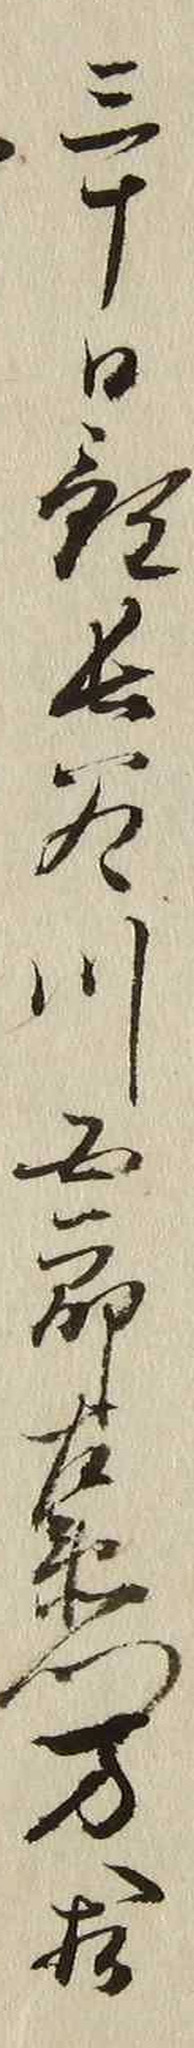三十日預長谷川五郎左衛門方へ相
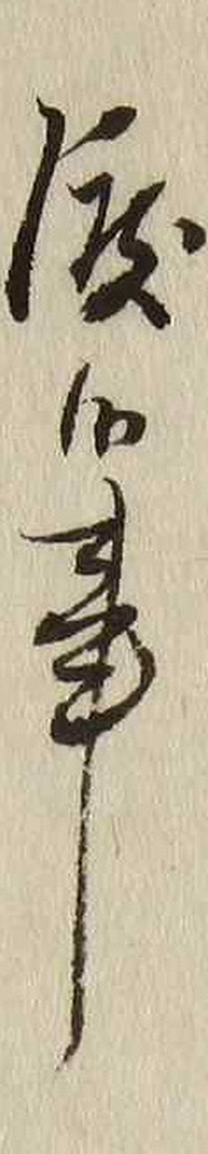渡候事
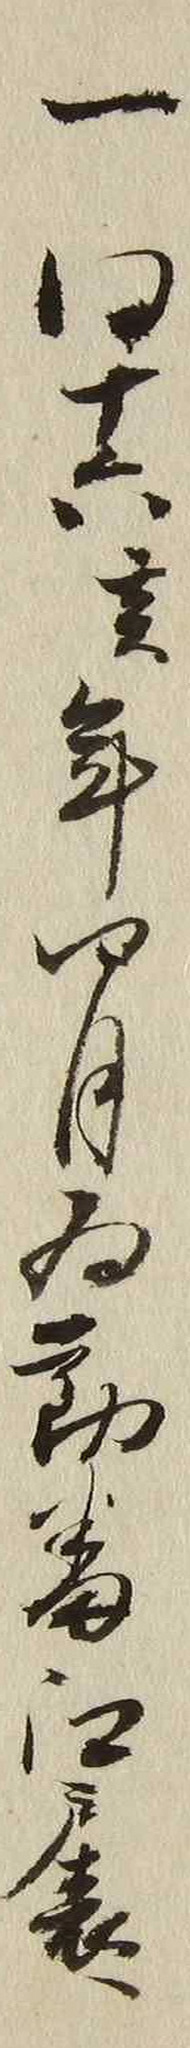一同十六亥年四月為勤番江戸表へ
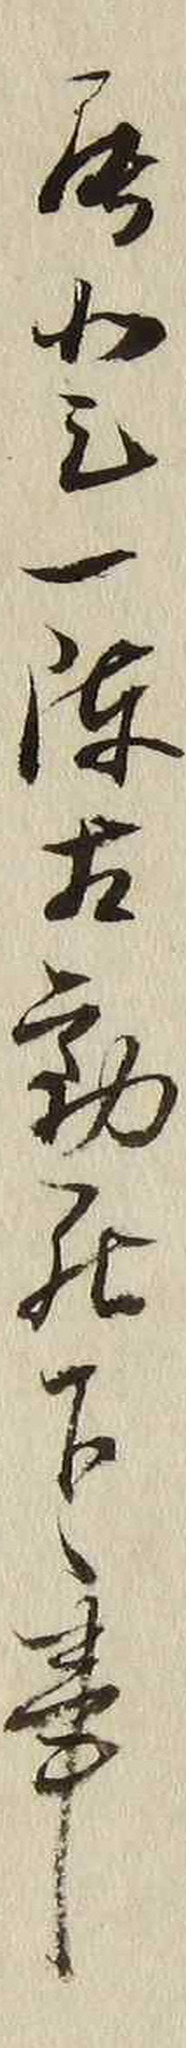罷登一陣相勤罷下候事
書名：諸士系譜　巻之348　も之部4
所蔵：会津若松市立会津図書館
